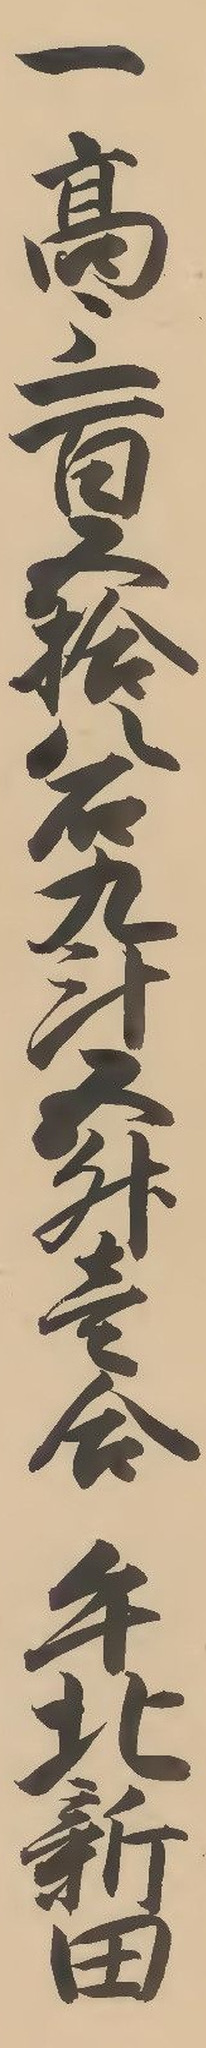一高三百五拾八石九斗五升壱合午北新田
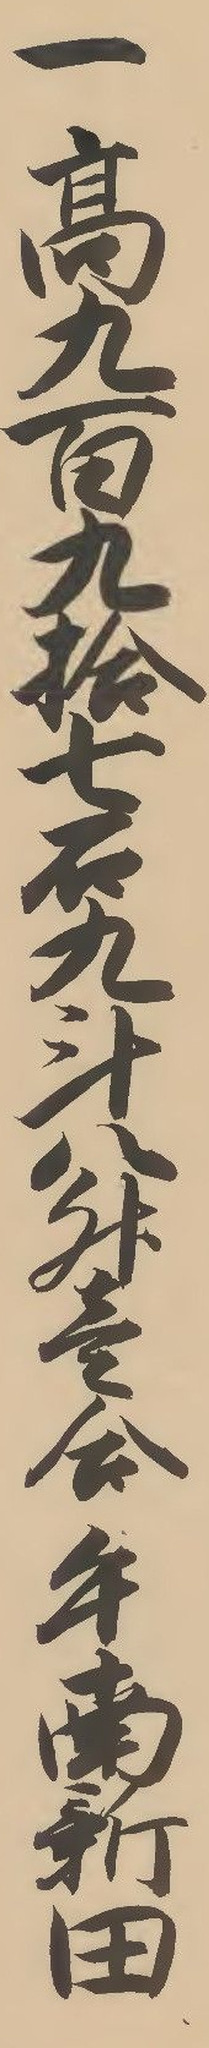一高九百九拾七石九斗八升壱合午南新田
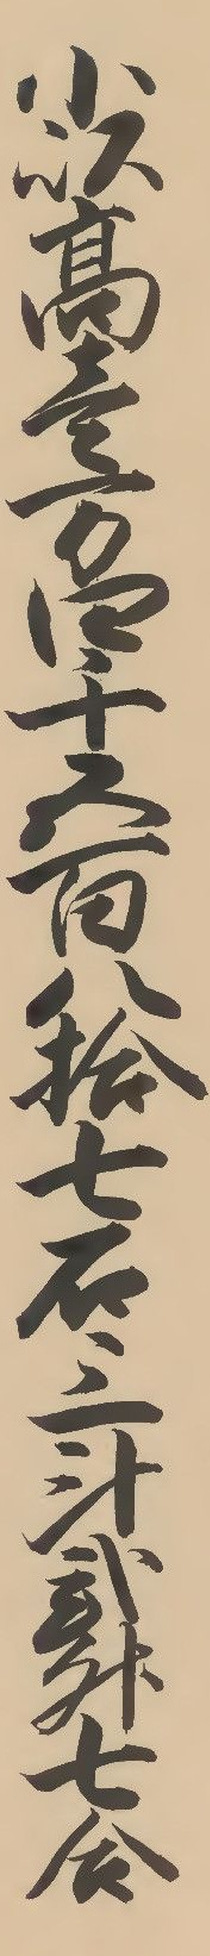小以高壱万四千五百八拾七石三斗弐升七合
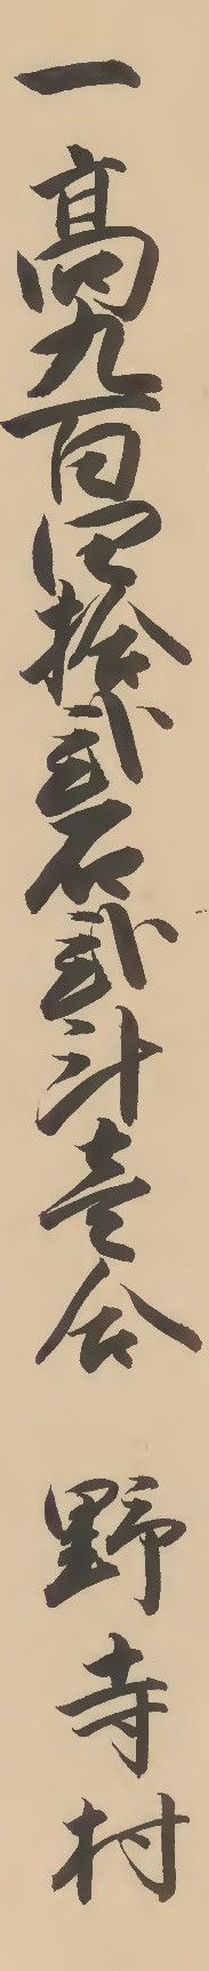一高九百四拾弐石弐斗壱合野寺村
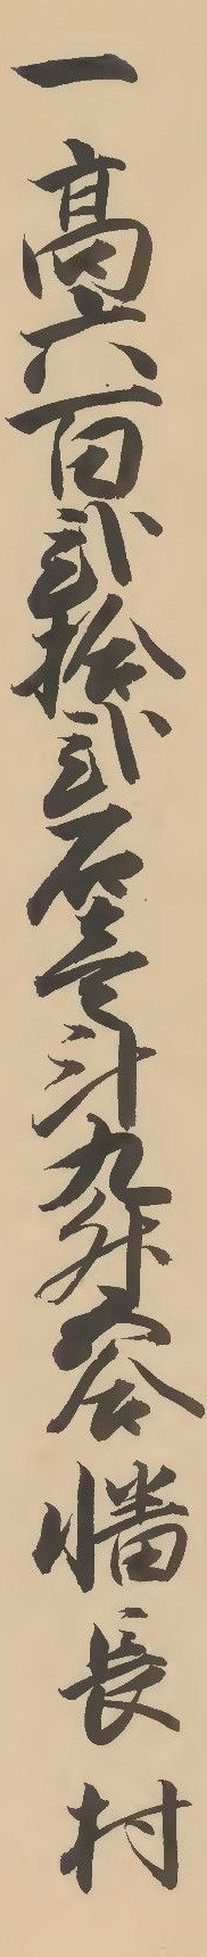一高六百弐拾弐石壱斗九升五合幡長村
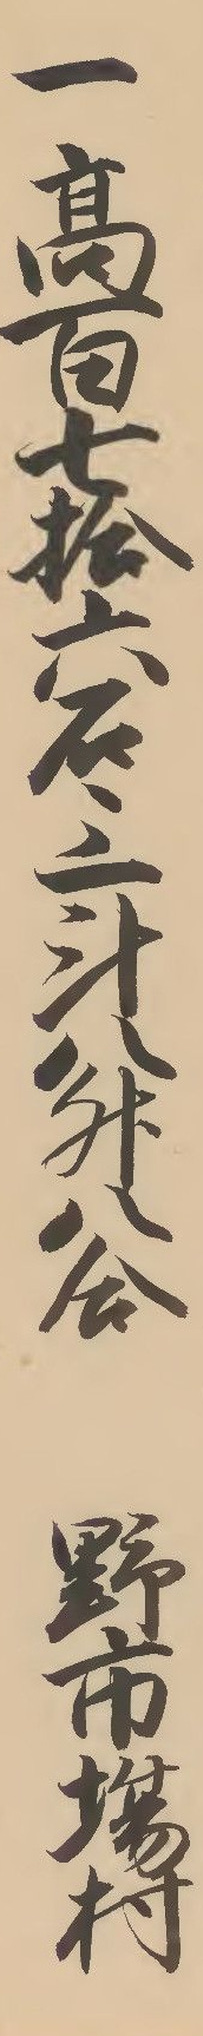一高百七拾六石三斗八升八合野市場村

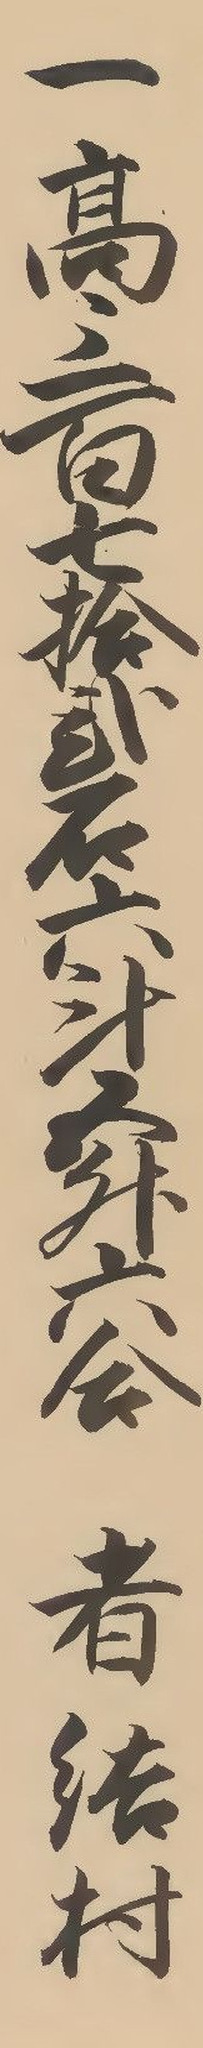一高三百七拾弐石六斗五升六合者結村
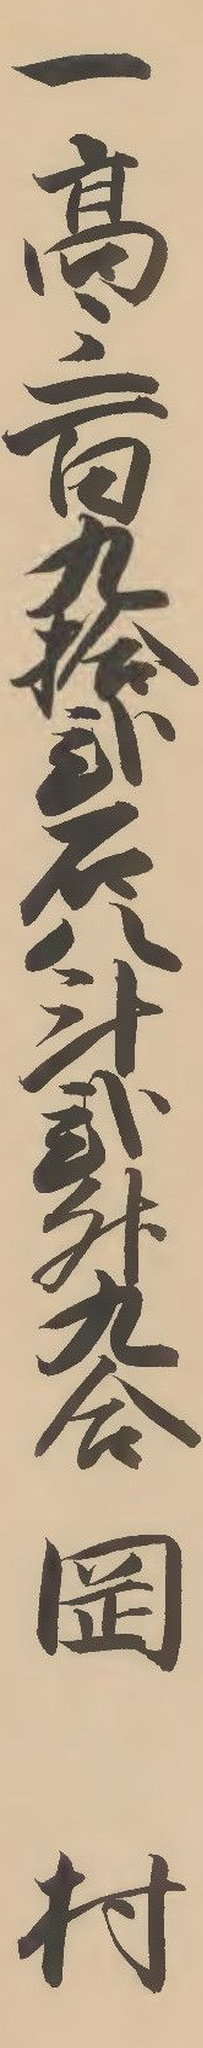一高三百九拾弐石八斗弐升九合岡村
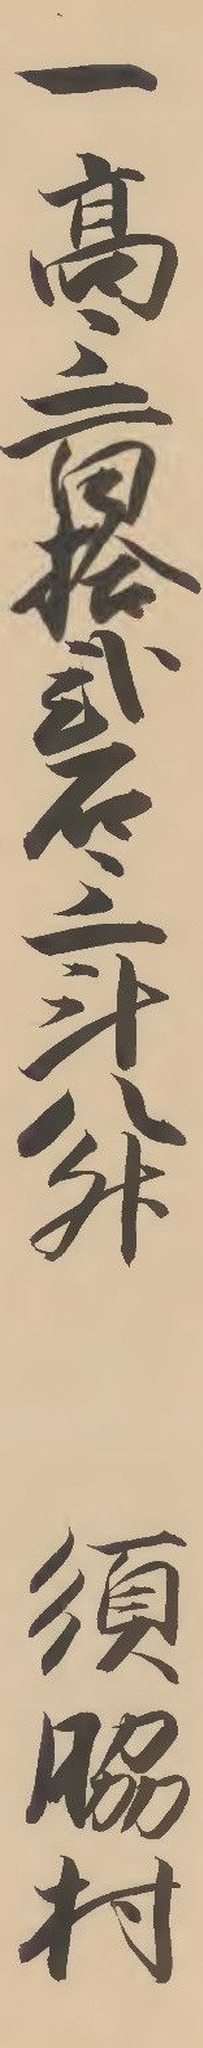一高三百拾弐石三斗八升須脇村
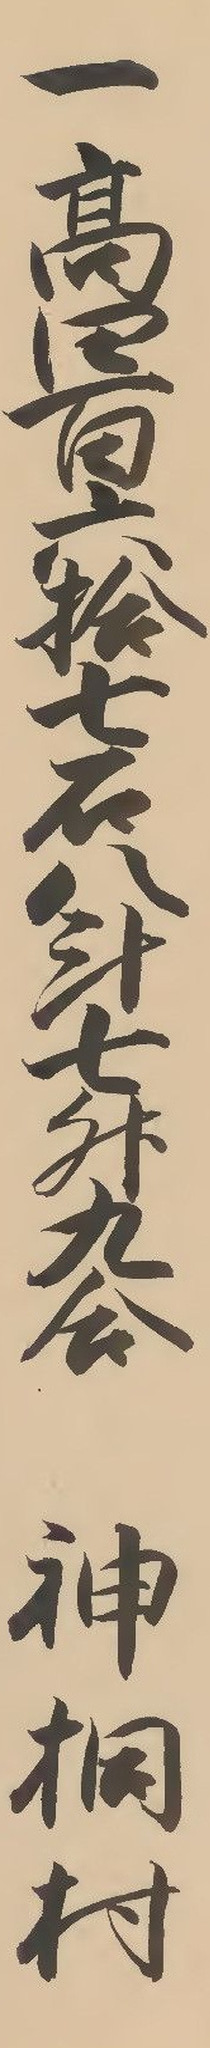一高四百六拾七石八斗七升九合神桐村
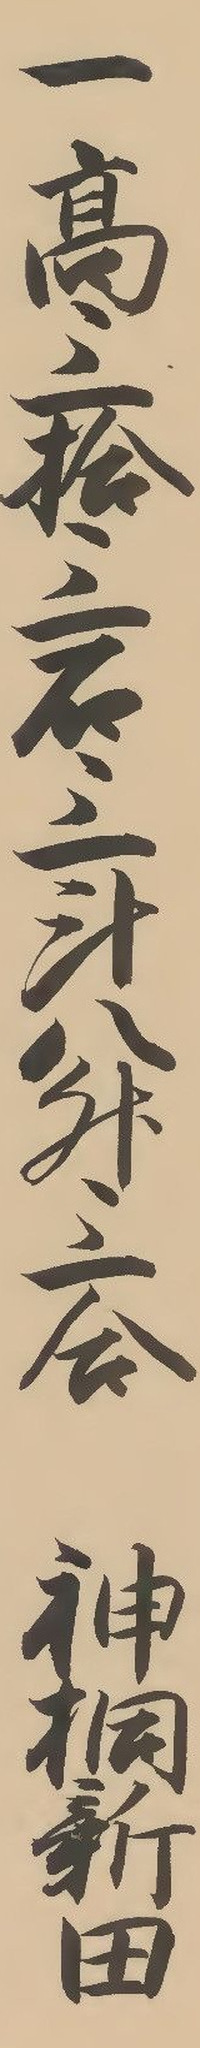一高三拾三石三斗八升三合神桐新田
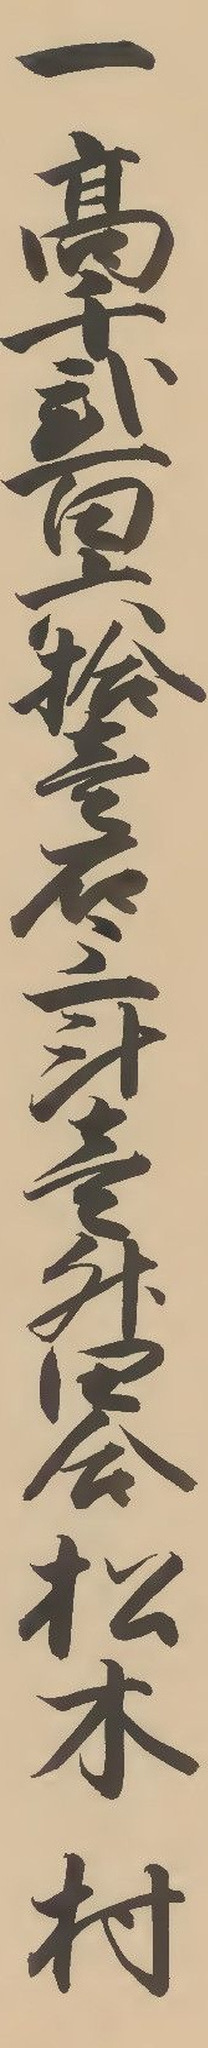一高千弐百六拾壱石三斗壱升四合松木村
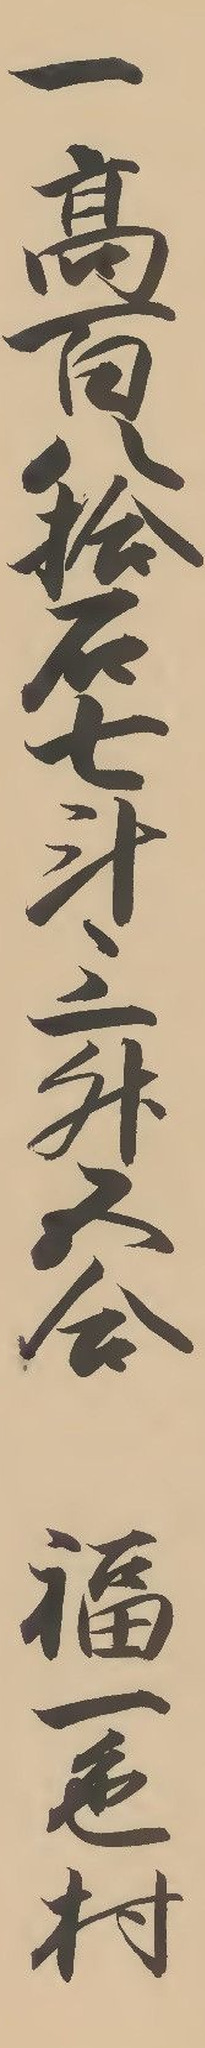一高百八拾石七斗三升五合福一色村
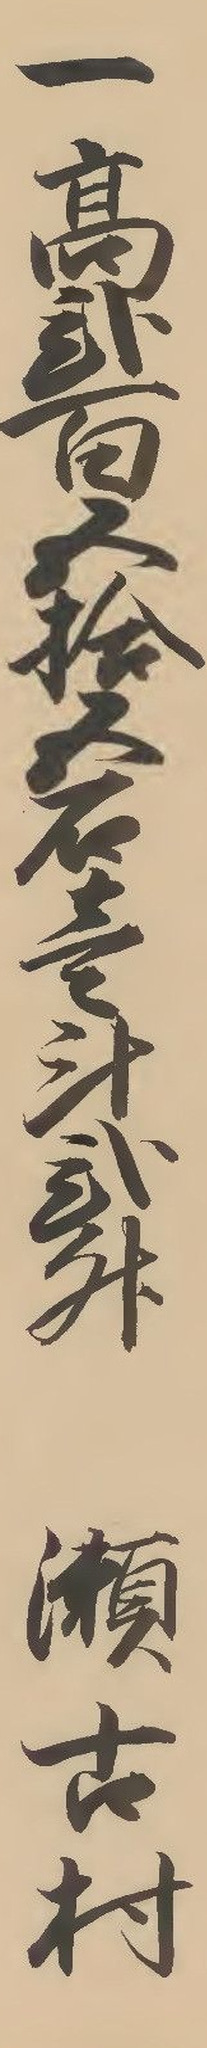一高弐百五拾五石壱斗弐升瀬古村

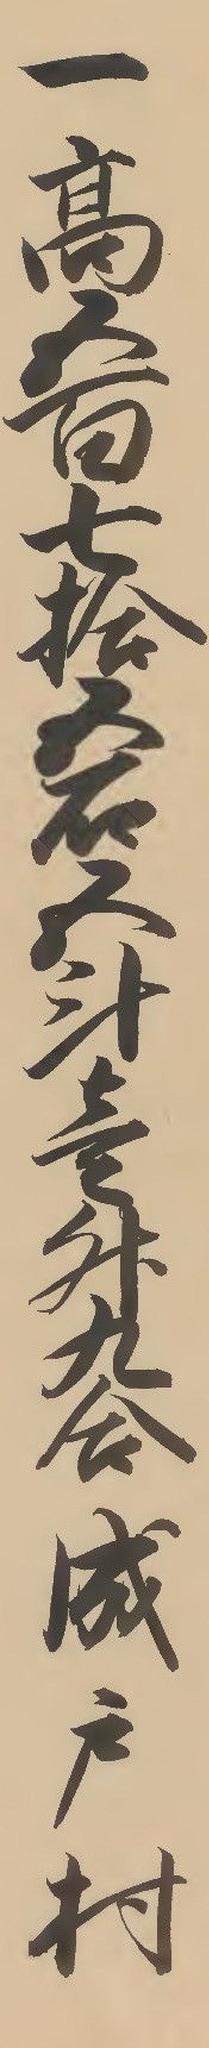一高五百七拾五石五斗壱升九合成戸村
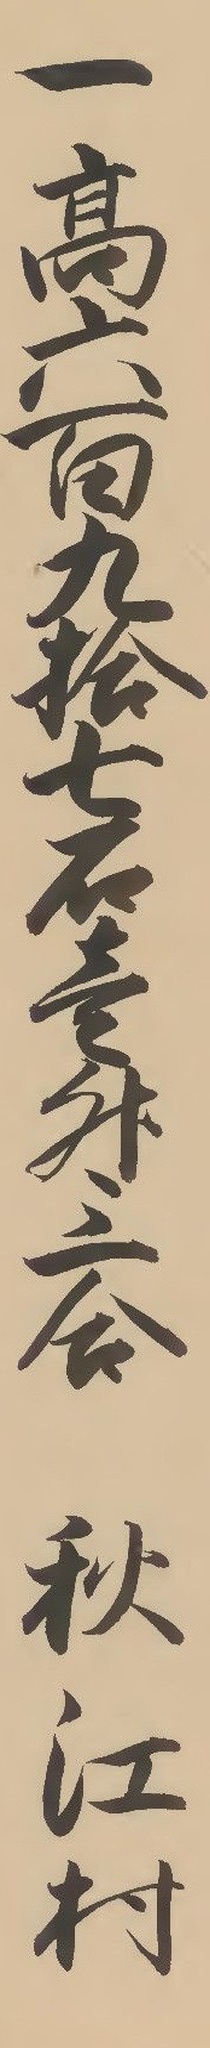一高六百九拾七石壱升三合秋江村
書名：美濃国郷帳
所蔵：国立公文書館 National Archives of Japan
